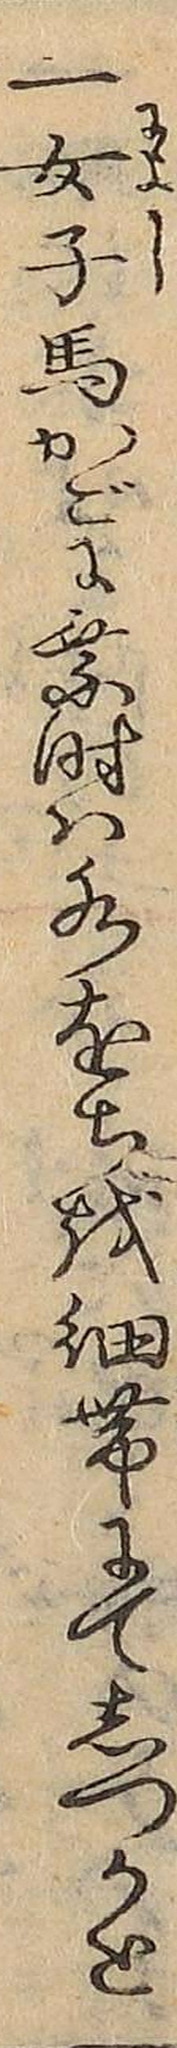一女子馬かごに乗時は水をちを細帯にてしつかと
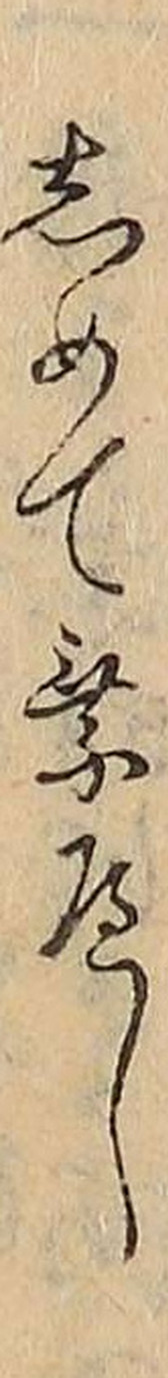しめて乗へし
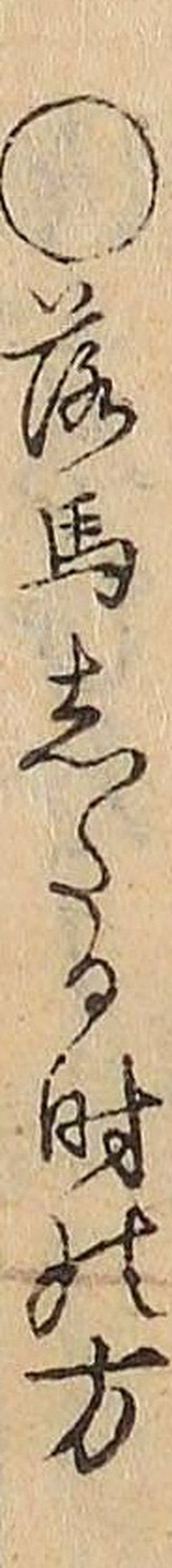○落馬したる時の方
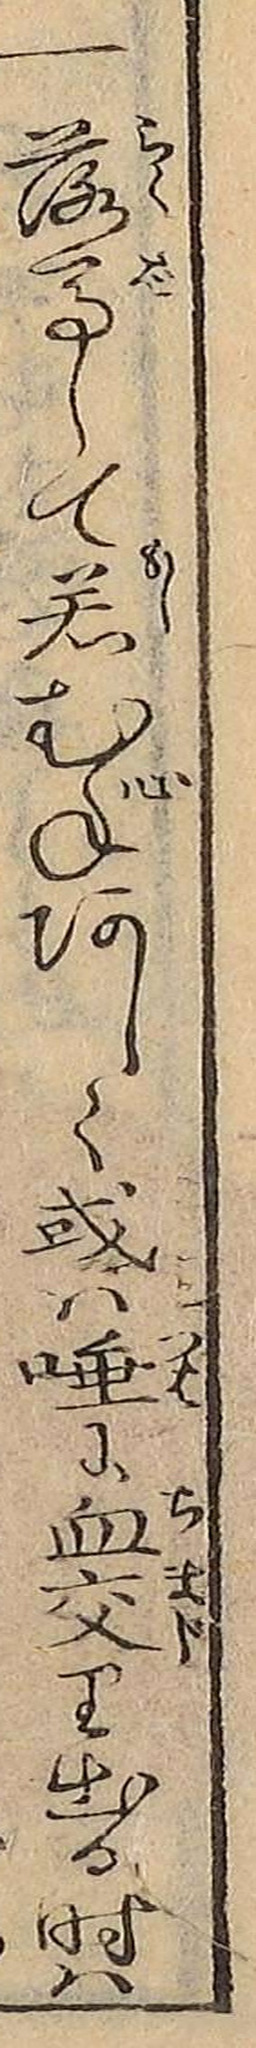一落馬して若むねあしく或は唾に血交り出る時は
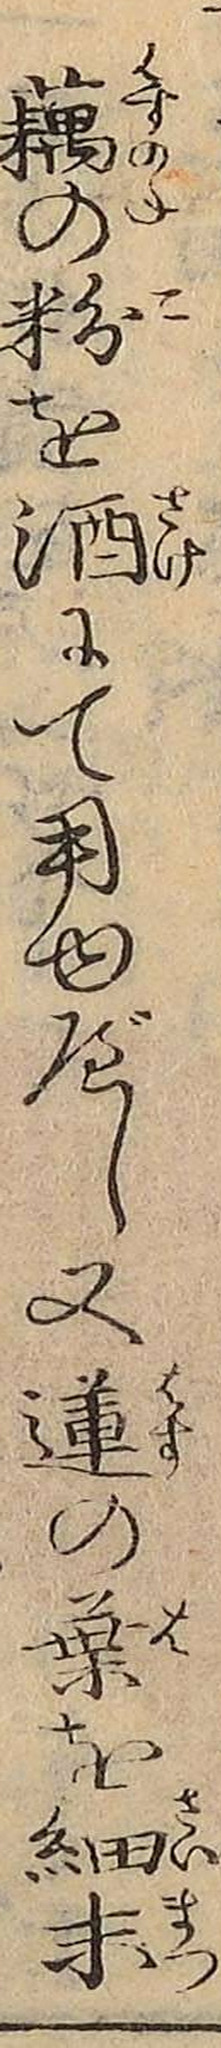藕の粉を酒にて用ゆべし又蓮の葉を細末
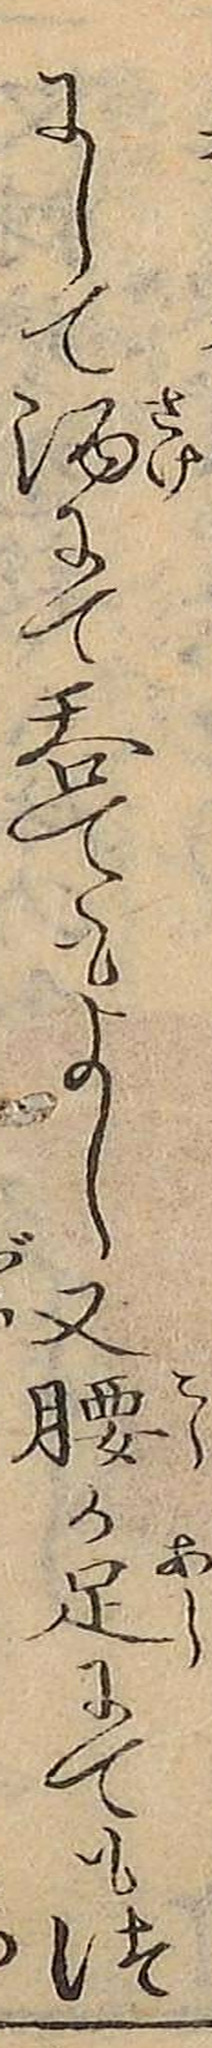にして酒にて呑てもよし又腰か足にてもつ
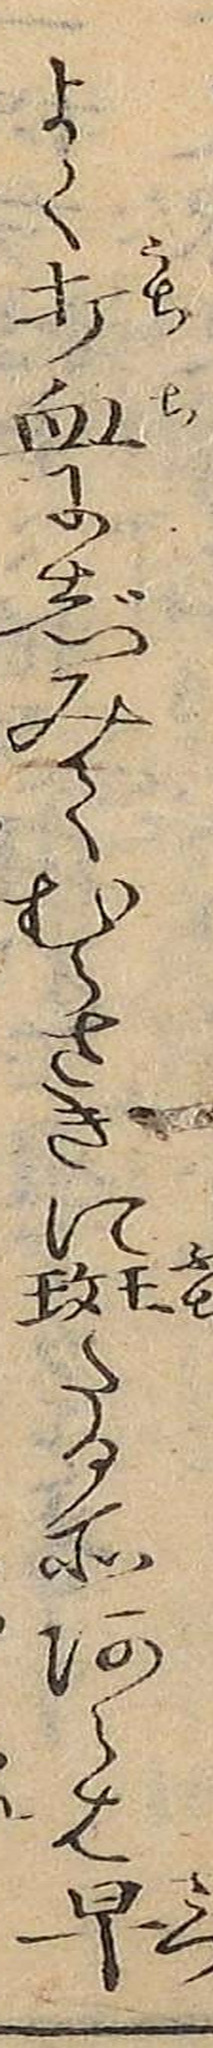よく打血にじみてむらさきに斑たる所あらは早
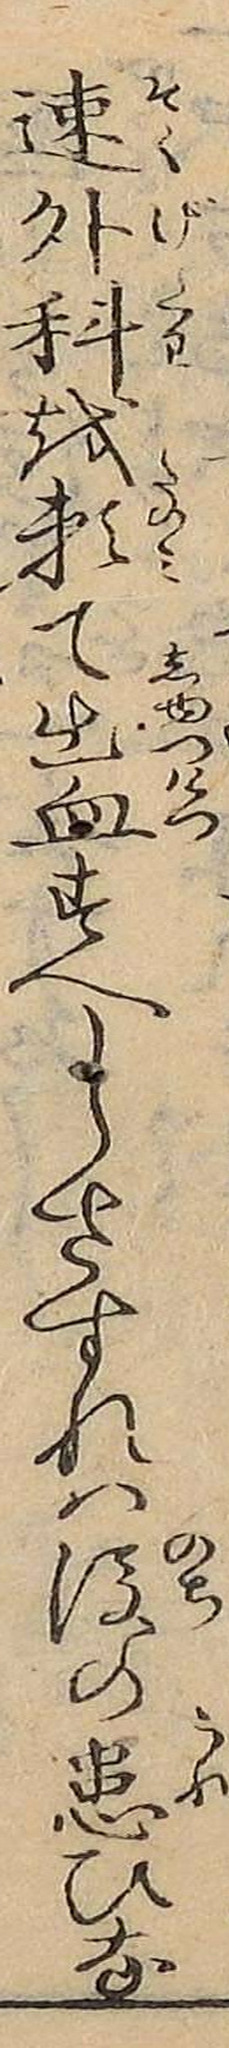速外科を頼て出血すへよししらさすれは後の患ひな
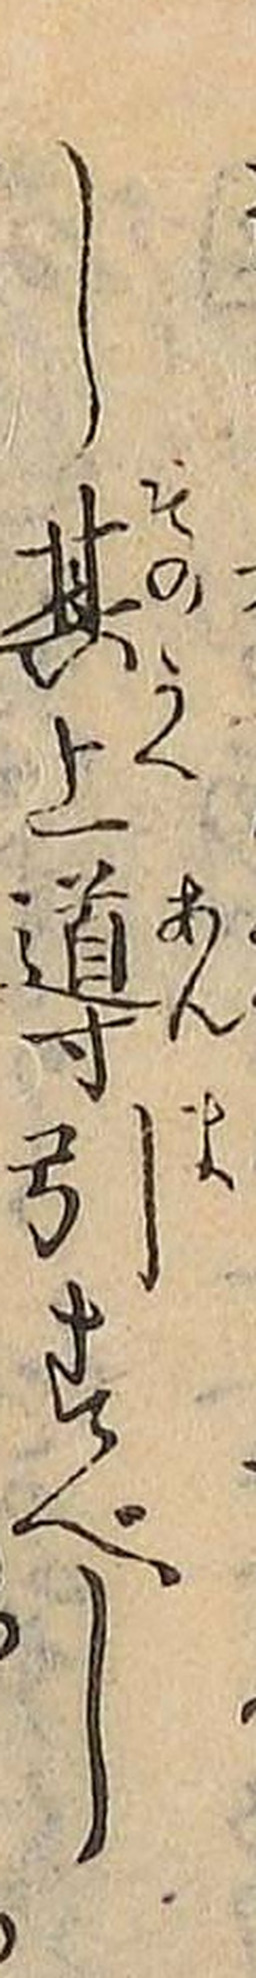し其上導引すべし
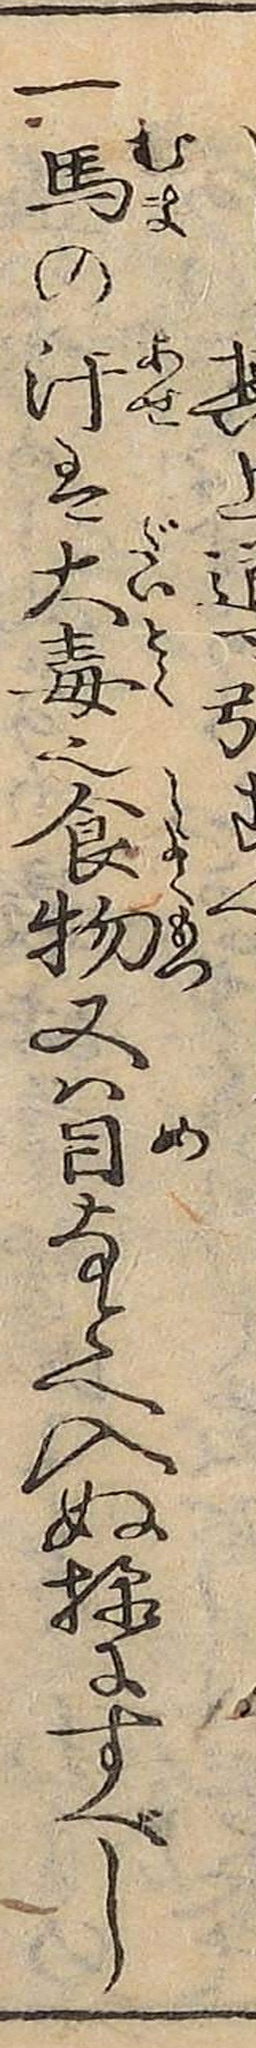一馬の汗は大毒也食物又は目なとへ入ぬ様にすべし
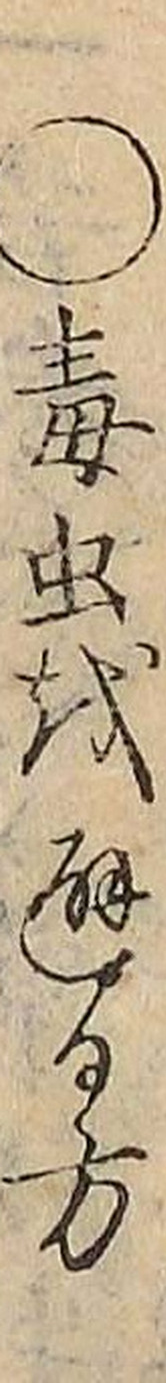○毒虫を避る方
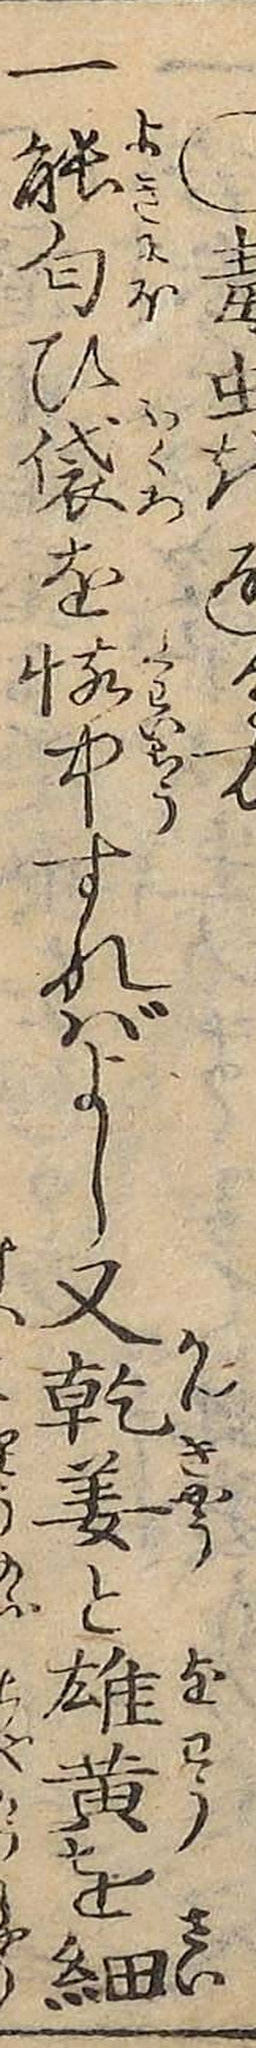一能匂ひ袋を懐中すればよし又乾姜と雄黄を細
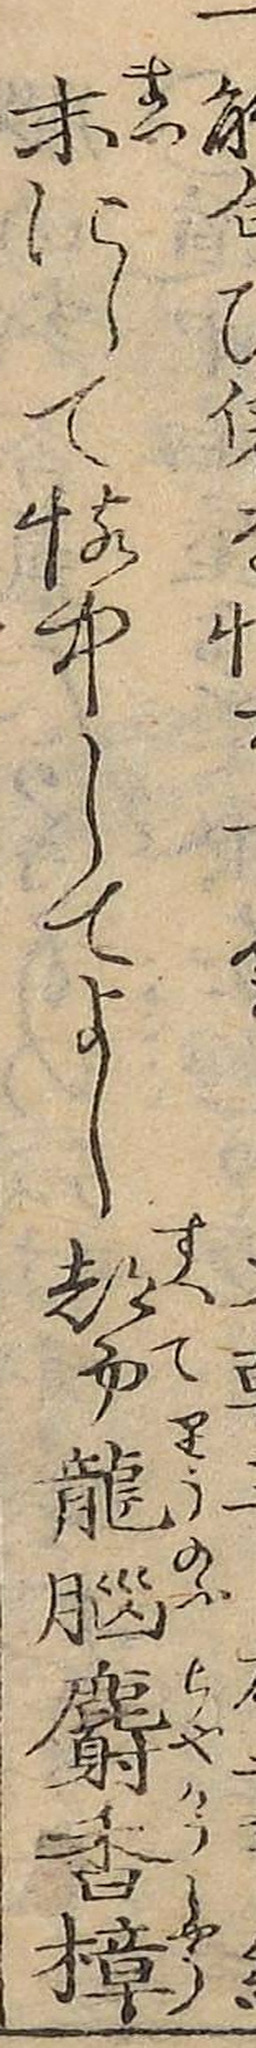末にして懐中してよし都而竜脳麝香樟

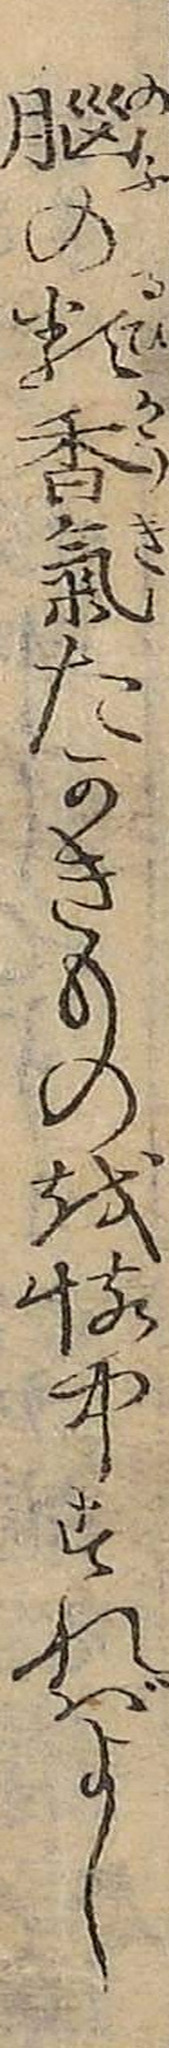脳の類香気たかきものを懐中すればよし
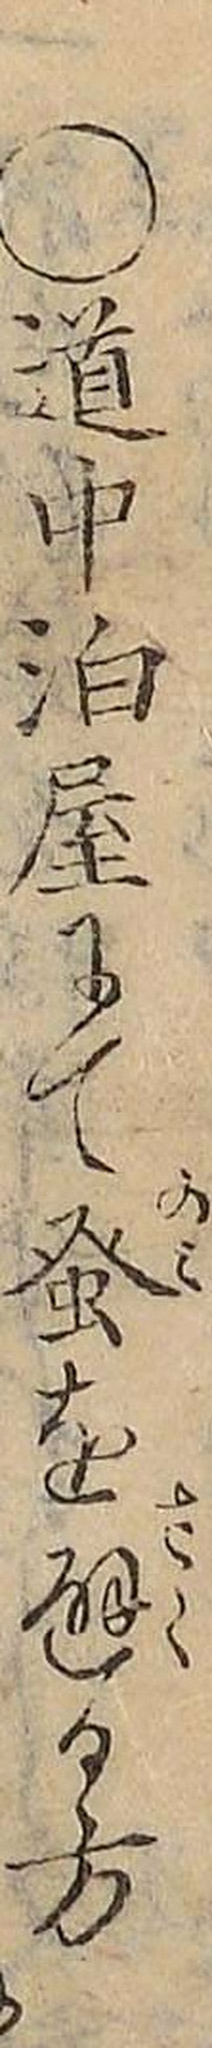○道中泊屋にて蚤を避る方
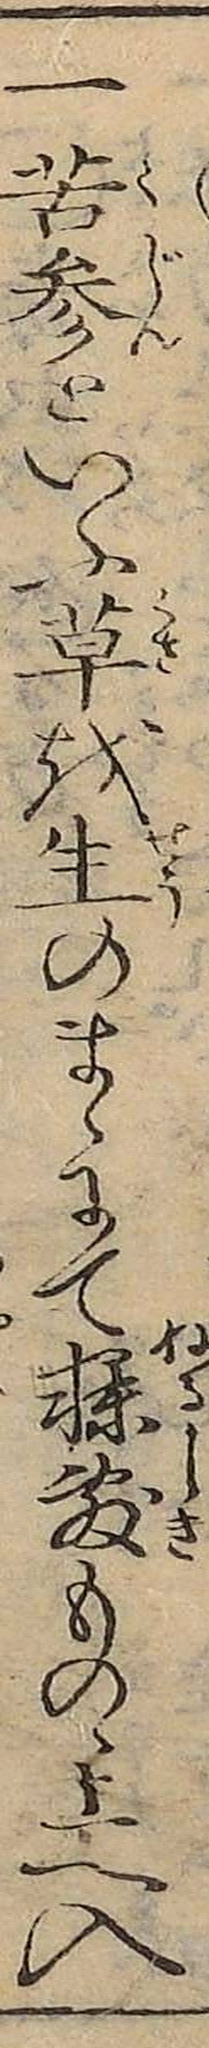一苦参といふ草を生のまゝにて寐敷ものゝ上へ入
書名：旅行用心集
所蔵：神戸大学附属図書館 国文学研究資料館
